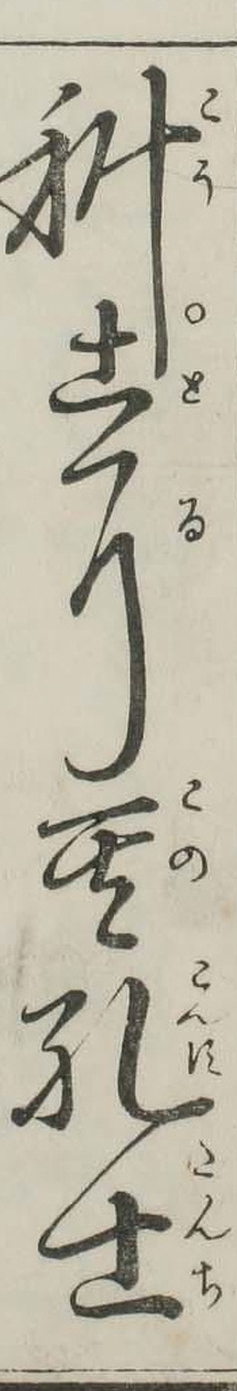科。土耳其孔士
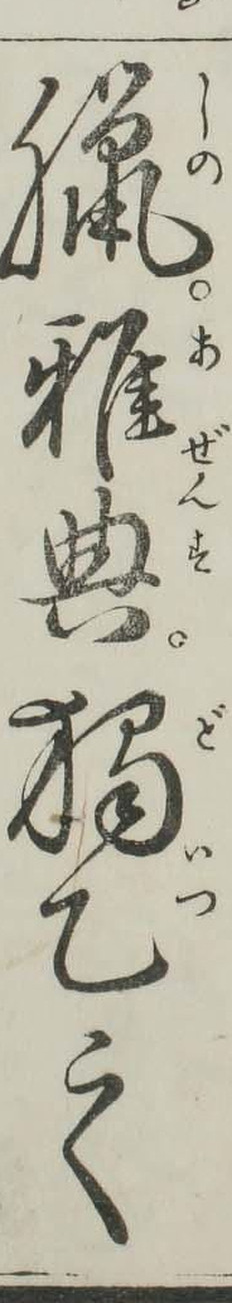臘。雅典。独乙之
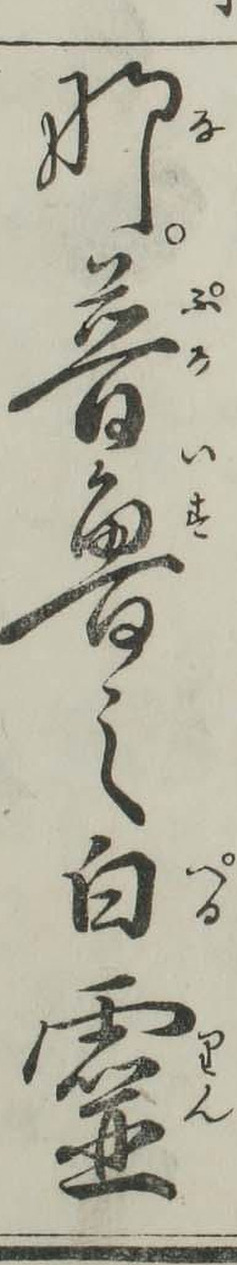那。普魯之白霊

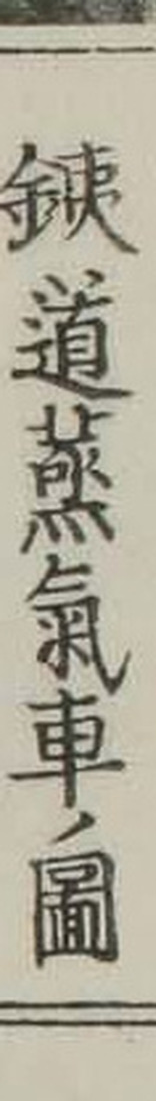鉄道蒸気車ノ図
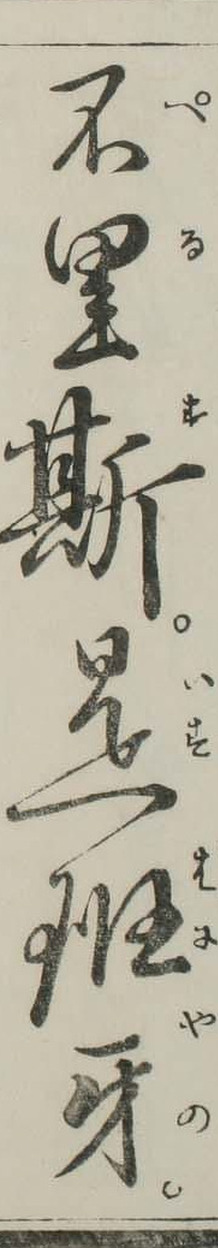不里斯。是班牙。
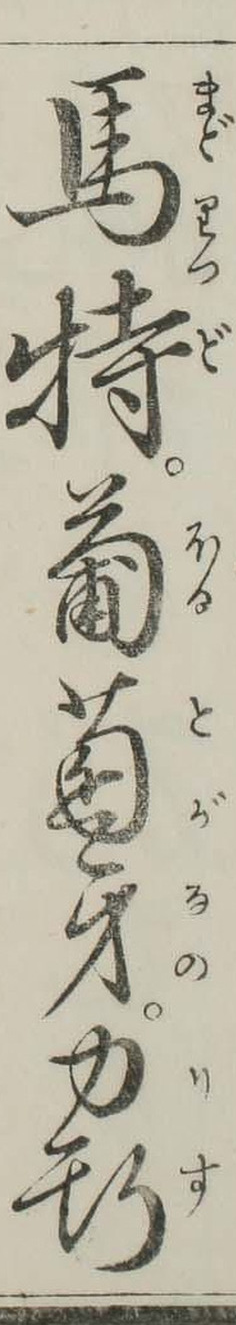馬特。葡萄牙。力斯
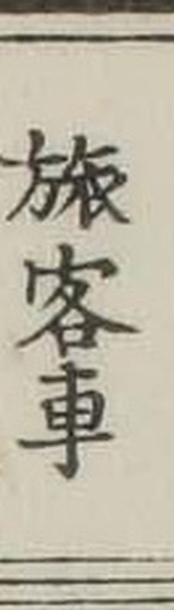旅客車
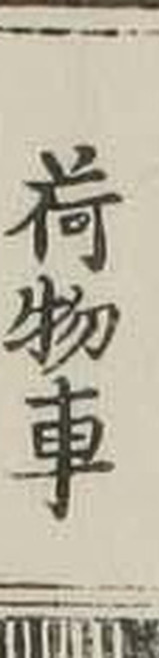荷物車
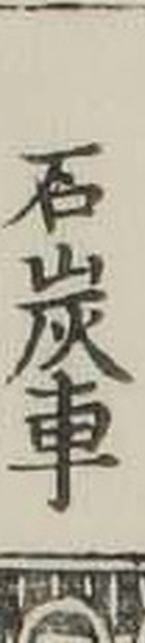石炭車
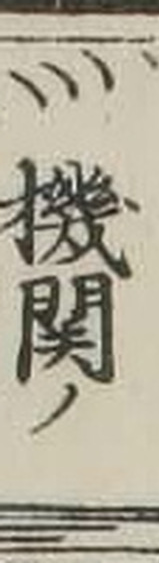機関ノ
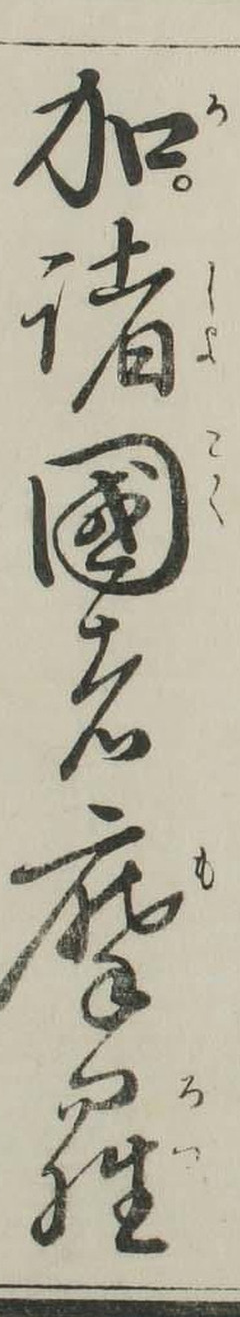加。諸国は摩羅

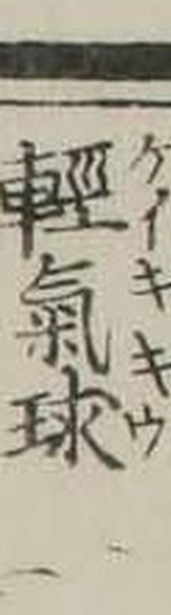軽気球
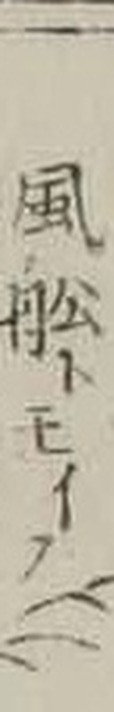風船トモイフ
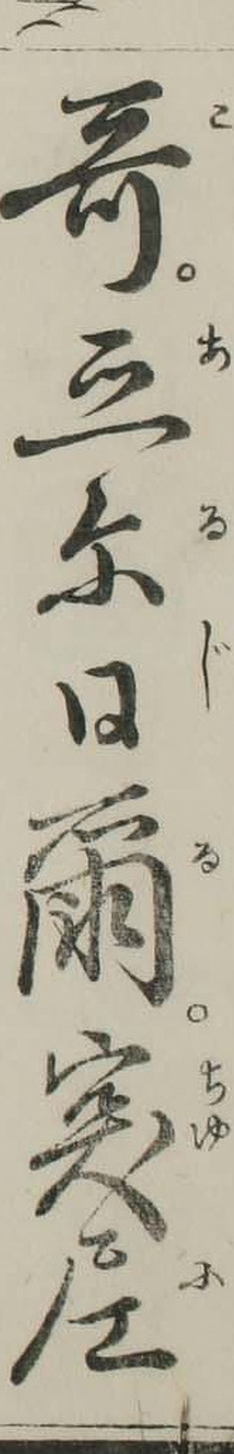哥。亜尓日爾。突尼
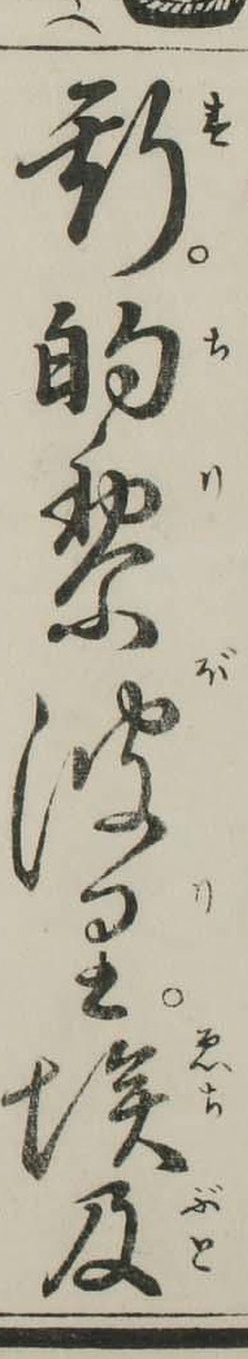斯。的黎波里。埃及
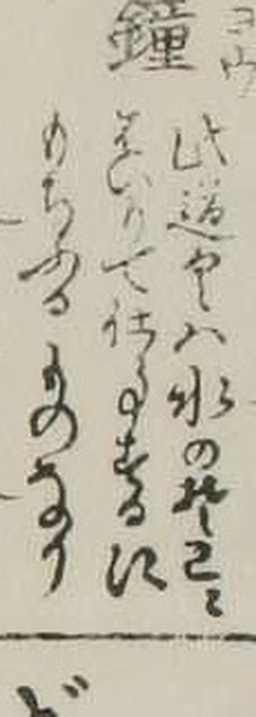はいりて仕事するに
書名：開化往来
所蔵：東京学芸大学教育コンテンツアーカイブ
